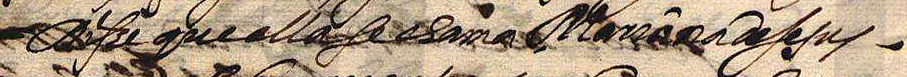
Disse que ella se chama Mariana de Jesus
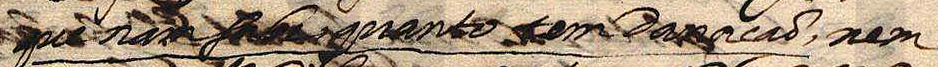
que nam sabe quanto tem da naçaõ, nem
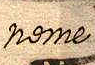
nome
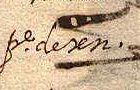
p.e de xn.
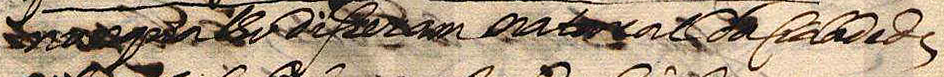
nunqua lhe disseram natural da Cidade de
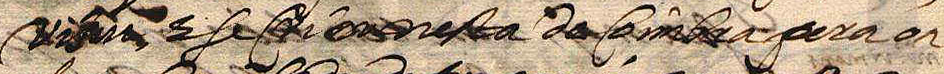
viseu E se Criou nesta de Coimbra pera on
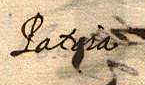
Patria
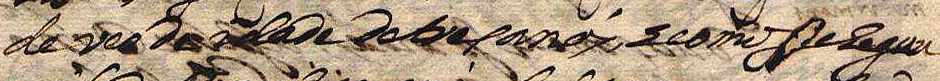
de veo de idade de tres anos, E como s chegou
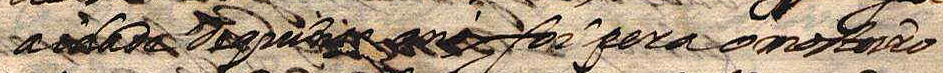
a idade de quinze anos foi pera o mosteiro
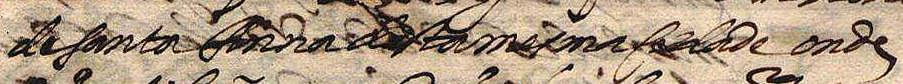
de santa Anna desta mesma Cidade onde
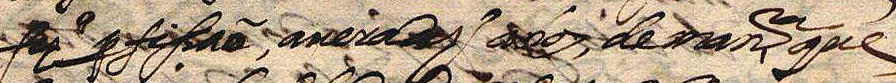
fez ꝓfissaõ, auera dez anos, de manra que
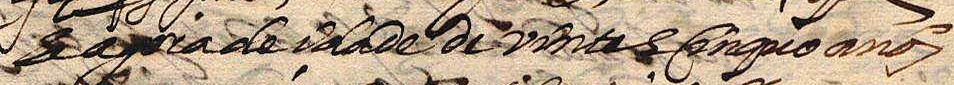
he agora de idade de vinte E Cinquo anos̄
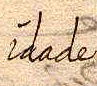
idade
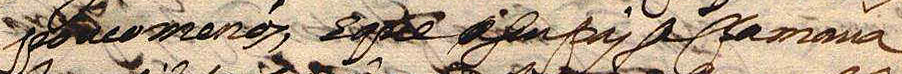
pouco menos, E que o seu paj se Chamaua
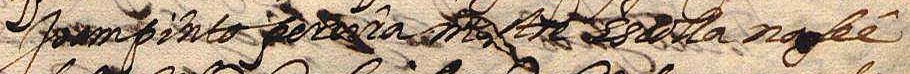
Joam pinto pereira mestre Escolla na seé
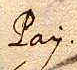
Pay.
